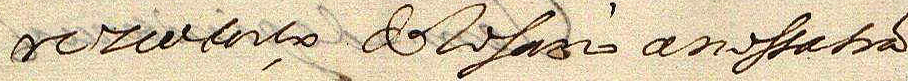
reze o terço do Rosario a nossa srā
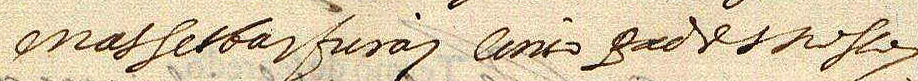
e nas sestas feiras cinco padres nossos
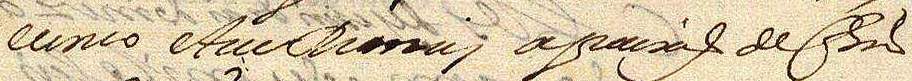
e cinco Aue Marias a paixaõ de Chrs̄
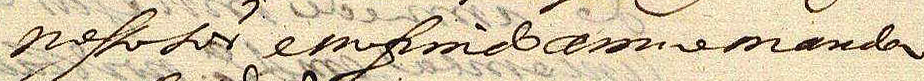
nosso sor̄ e no fim do anno manda
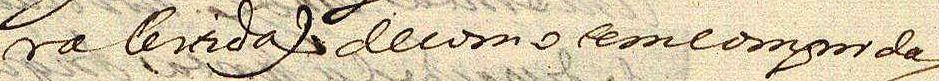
ra Certidaõ de como tem compridas
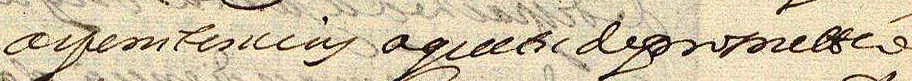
as penitencias a que tudo prometteo
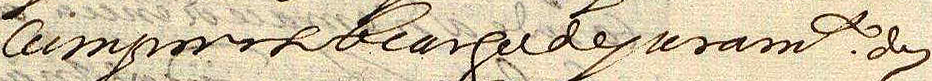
cumprir sob cargo de juramto. dos
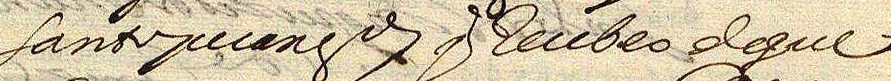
santos euangos q̄ Recebeo de que
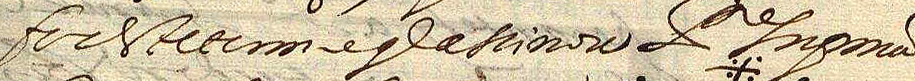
fiz este termo q̄ assinou Po Lupina
